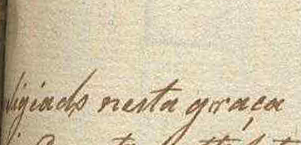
igiado nesta graça
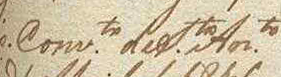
Conv.to de S.to An.to
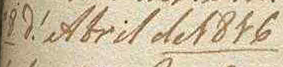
8 d.'Abril de 1816
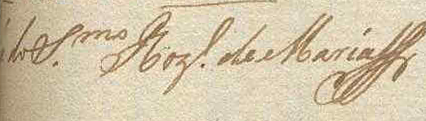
do S.mo Roz.o de Maria
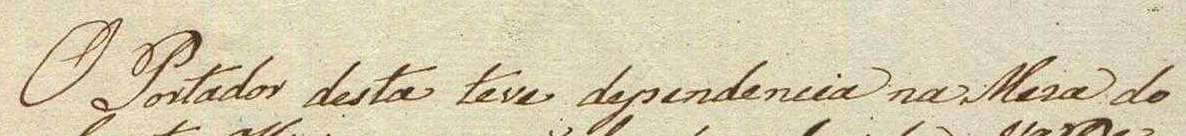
O Portador desta teve dependencia na Meza do
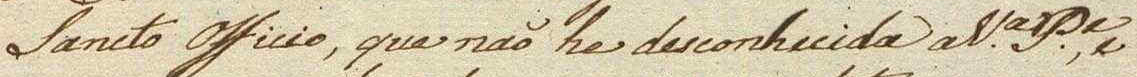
Sancto Officio, que naõ he desconhecida a V.a P.a, e
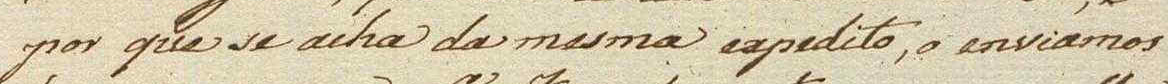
por que se acha da mesma expedito, o enviamos
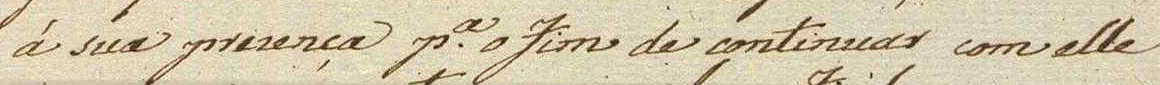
á sua prezença p.a o fim de continuar com elle
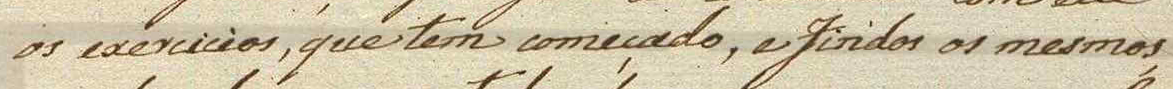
os exercicios, que tem começado, e findos os mesmos
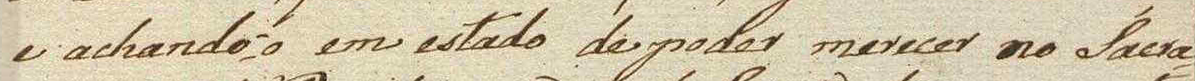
e achandó-o em estado de poder merecer no Sacra
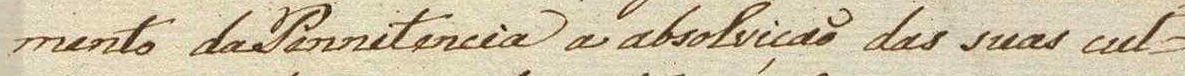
mento da Pennitencia a absolviçaõ das suas cul
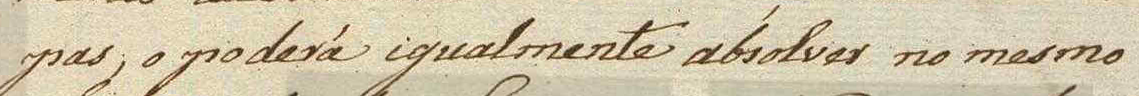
pas, o poderá igualmente absolver no mesmo
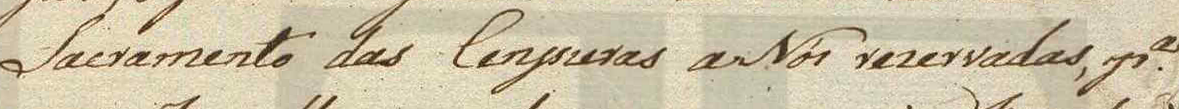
Sacramento das Censsuras a Nós rezervadas, p.a
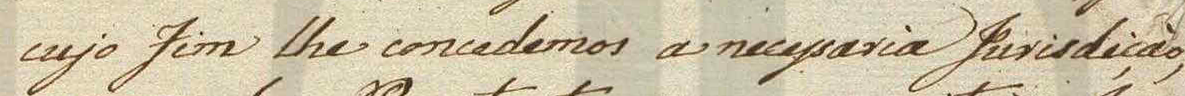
cujo fim lhe concedemos a necessaria Jurisdiçaõ,
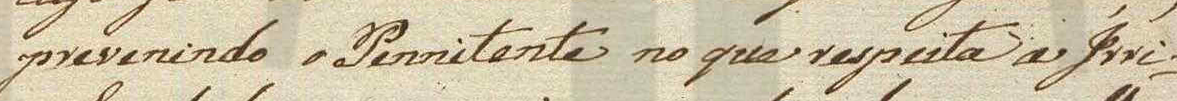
prevenindo o Pennitente no que respeita a Jrri
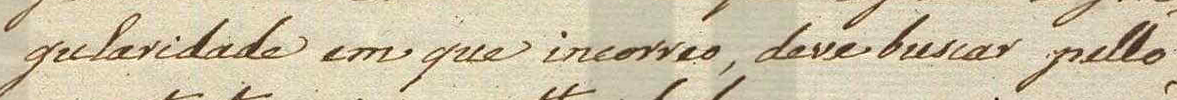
gularidade em que incorreo, deve buscar pello
